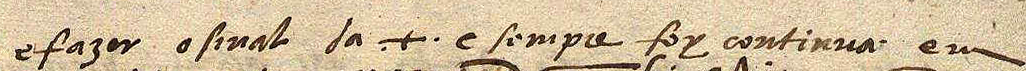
e fazer o sinal da .+. e sempre foy continua em
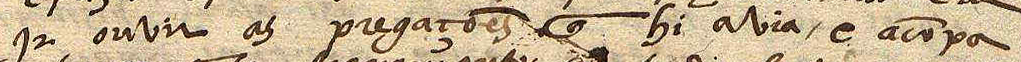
jr ouvir as pregações q̄ hi avia / e ac̄opa
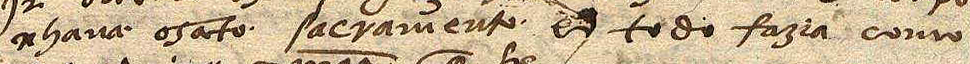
nhaua o sāto. sacramento. e ē todo fazia como
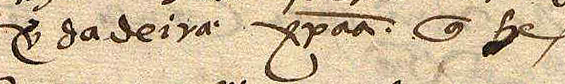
ꝟdadeira xp̄aa. q̄ he
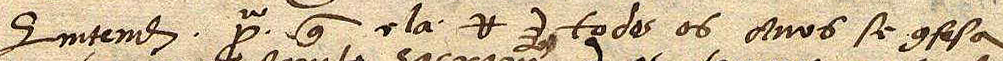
Emtemd. ꝓ̄. q̄ ela. R ē todos os anos se ꝯfesa
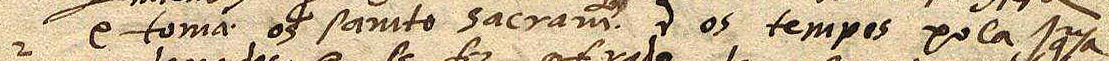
e toma. os santo sacramtos. ē os tempos pola Jḡja
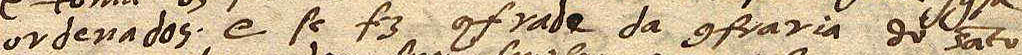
ordenados. e se fez ꝯfrade da ꝯfraria do sāto
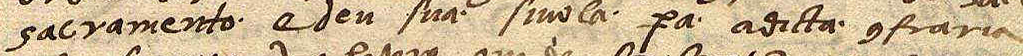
sacramento. e deu sua smola. ꝑa a dicta. ꝯfraria
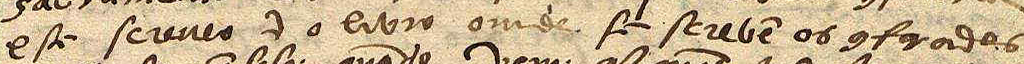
e se screueo ē o livro omde se screvē os ꝯfrades
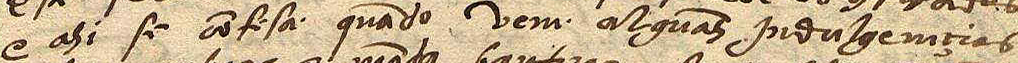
e asi se c̄ofesa. quādo vem algūas Jndulgemcias
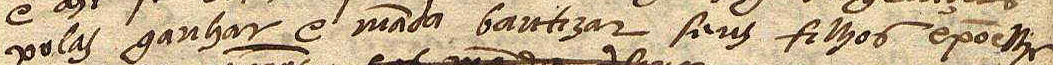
polas ganhar e māda bautizar seus filhos e põelhe
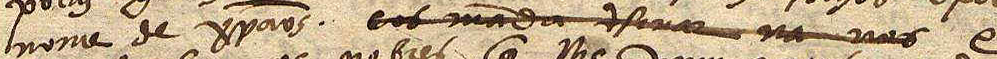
nome de xpãos. e os māda ēsinar na nos e
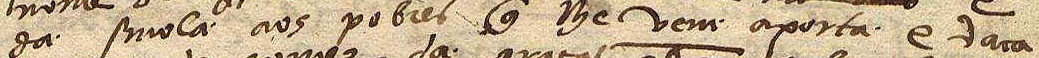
da. smola. aos pobres q̄ lhe vem a porta. e ē aca
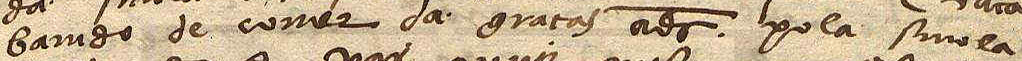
bamdo de comer da graças a ds̄. pola smola
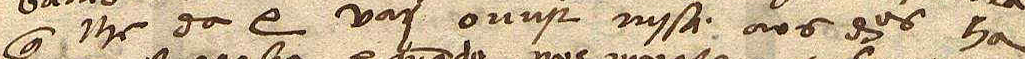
q̄ lhe da e vay ouujr mjsa aos dos ha
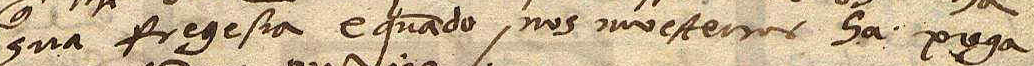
sua fregesia e quādo nos moesteiros ha prega
